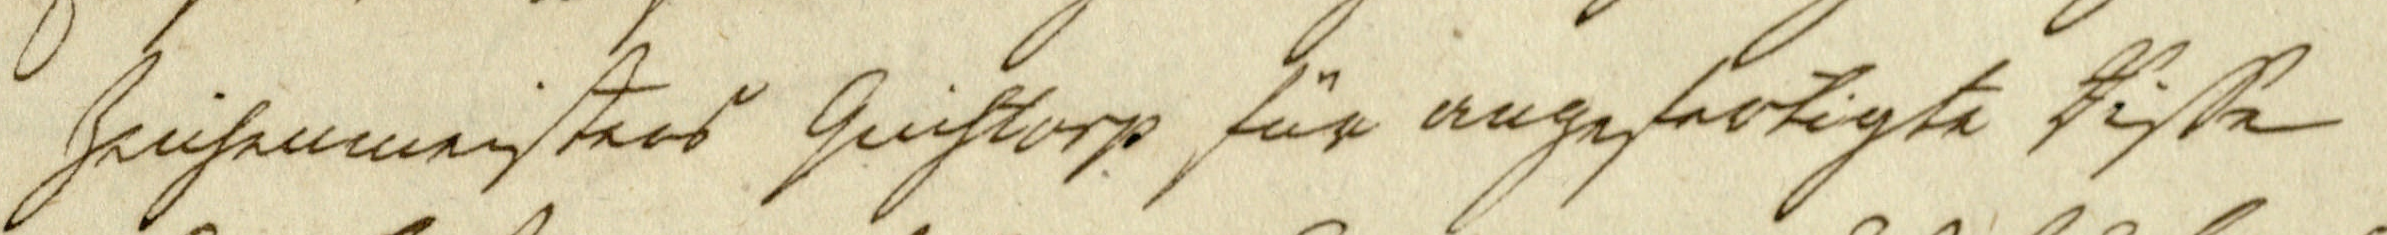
Zeichenmeisters Quistorp für angefertigte Risse
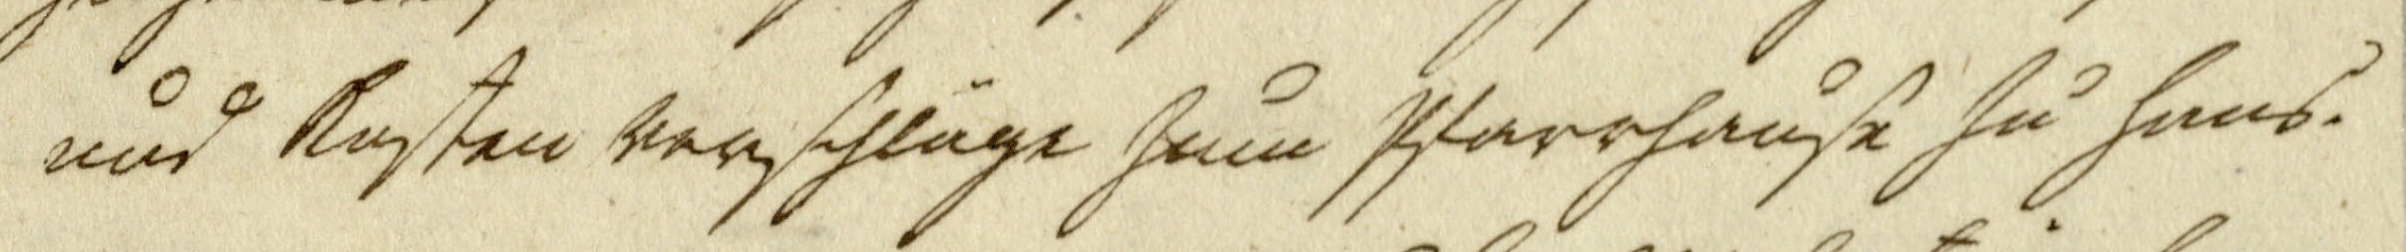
und Kosten Vorschläge zum Pfarrhause zu Hans¬
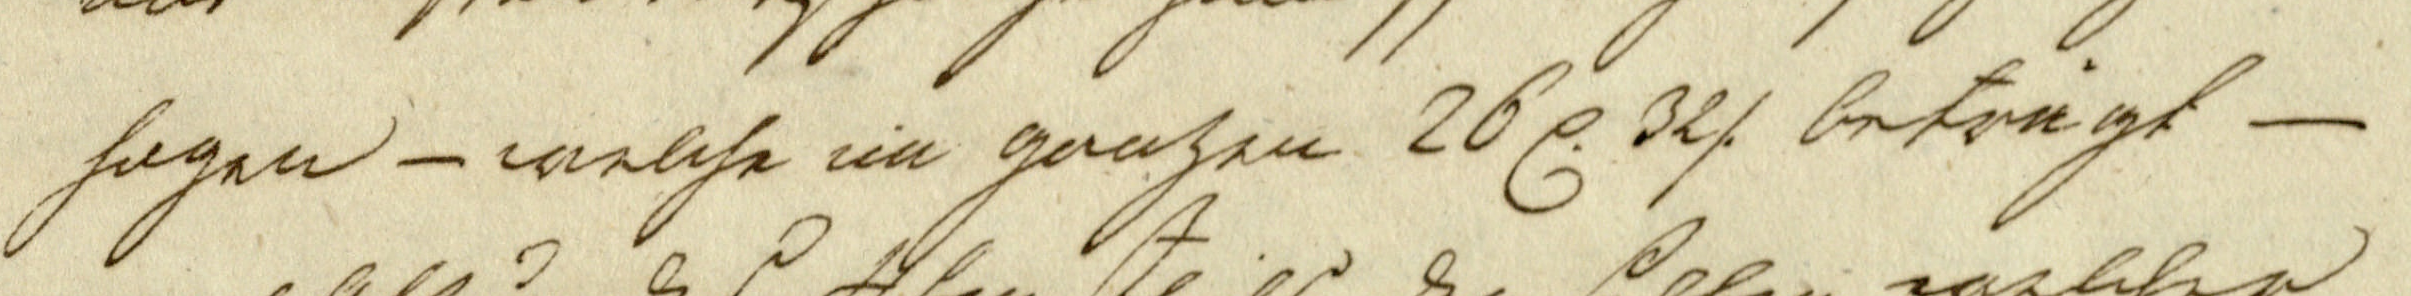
hagen, welche im ganzen 26 l. 32 s. beträgt
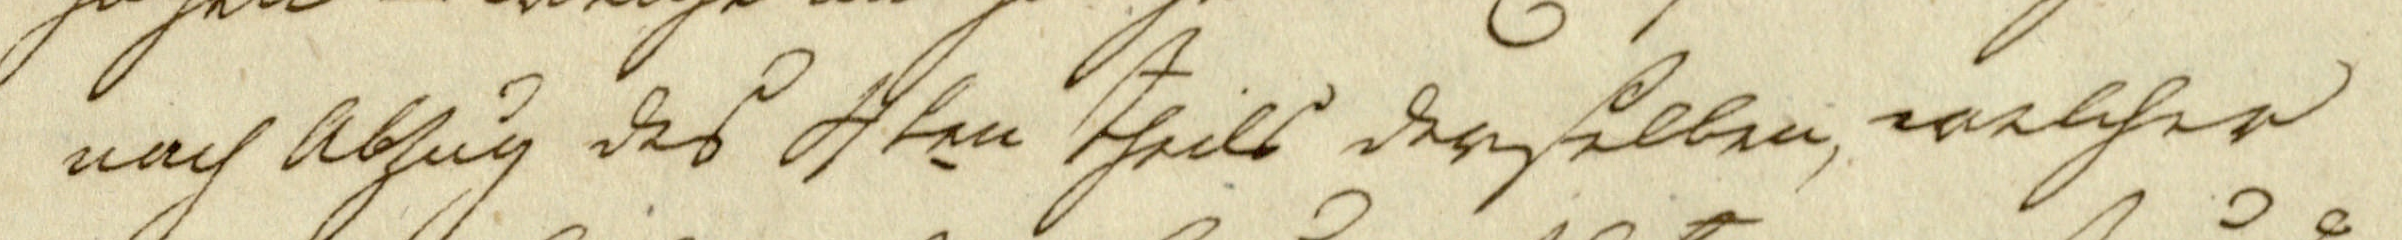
nach Abzug des 4 ten Theils derselben, welcher
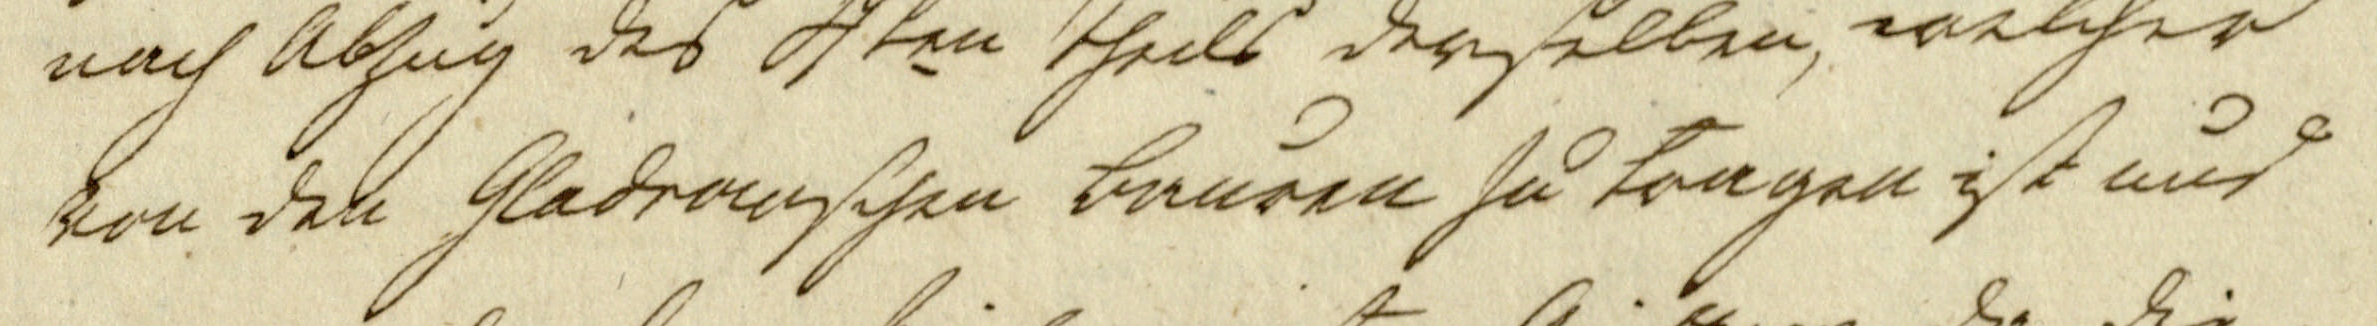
von den Gladrowschen Bauren zu tragen ist und
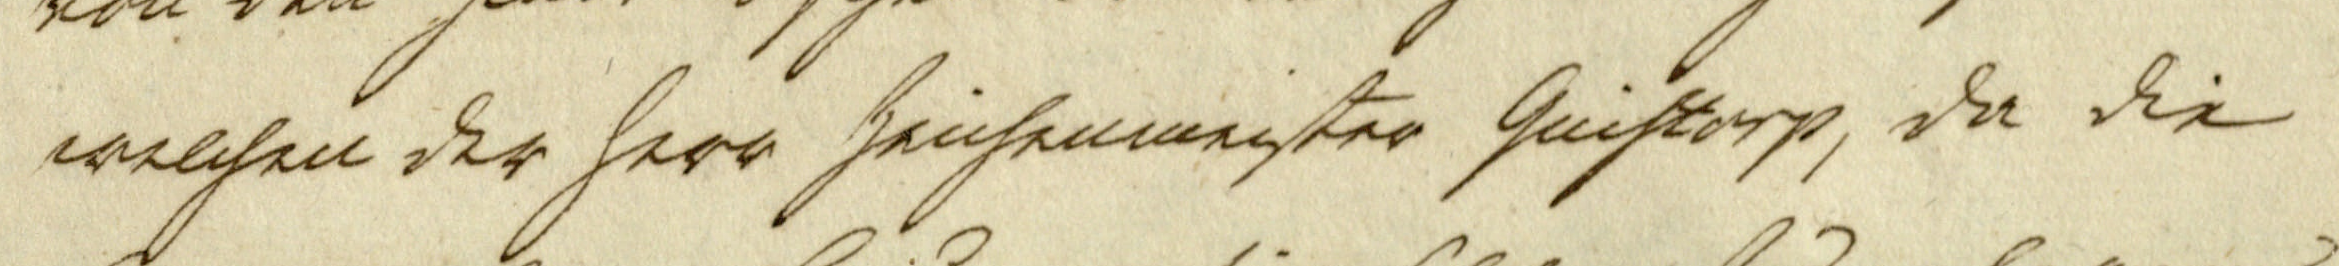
welchen der Herr Zeichenmeister Quistorp, da die
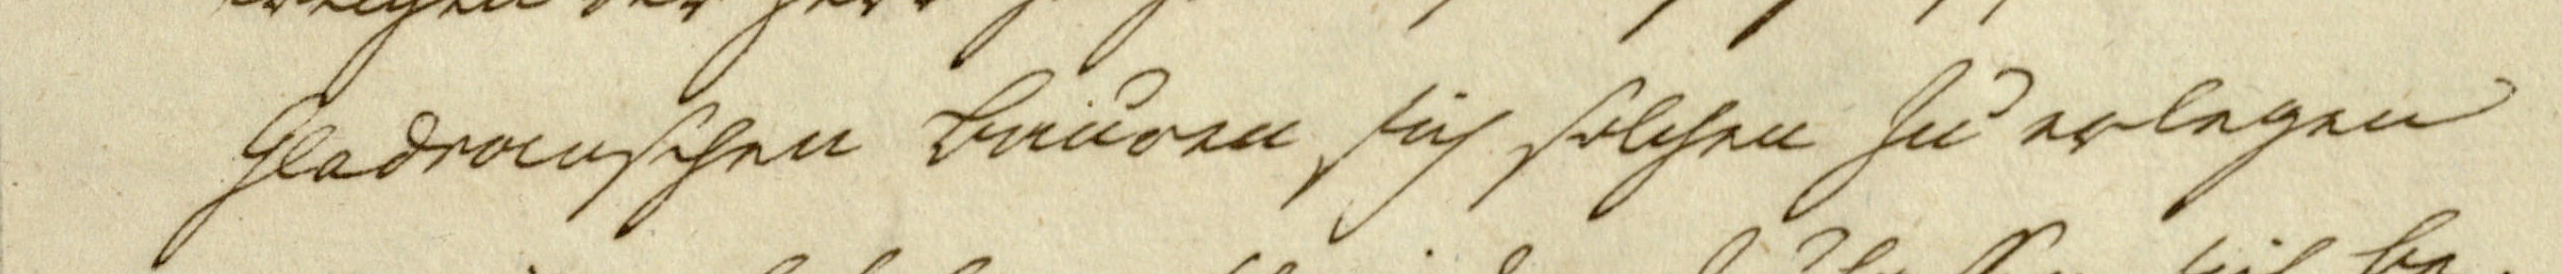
Gladrowschen Bauren sich solche zu erlegen
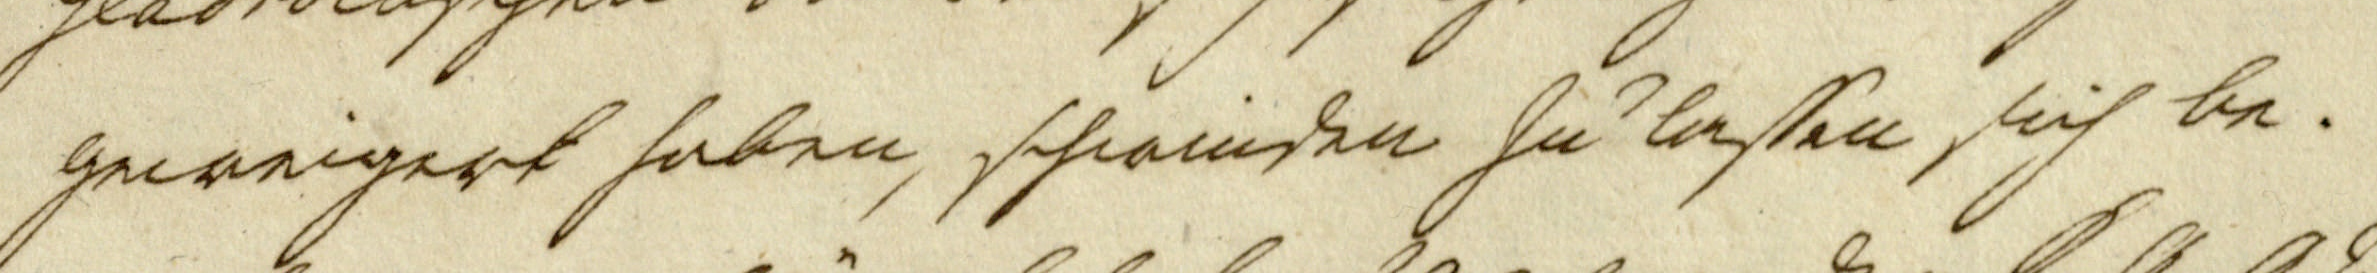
geweigert haben, schwinden zu lassen sich be¬
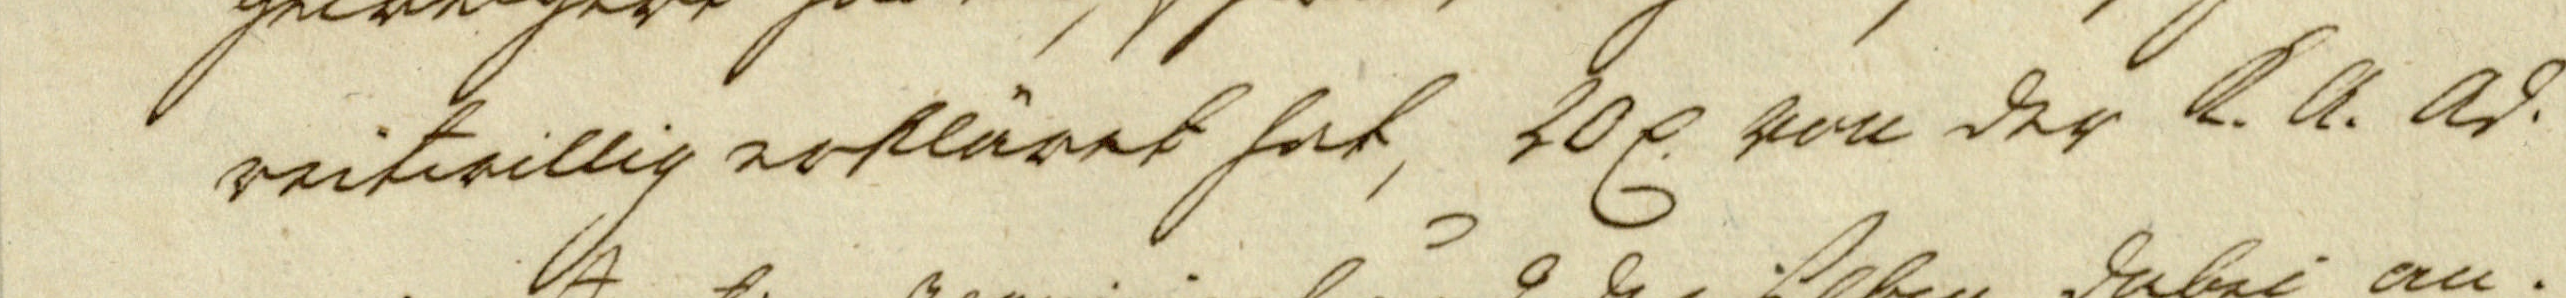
reitwillig erkläret hat, 20 l. von der K. A. Ad¬
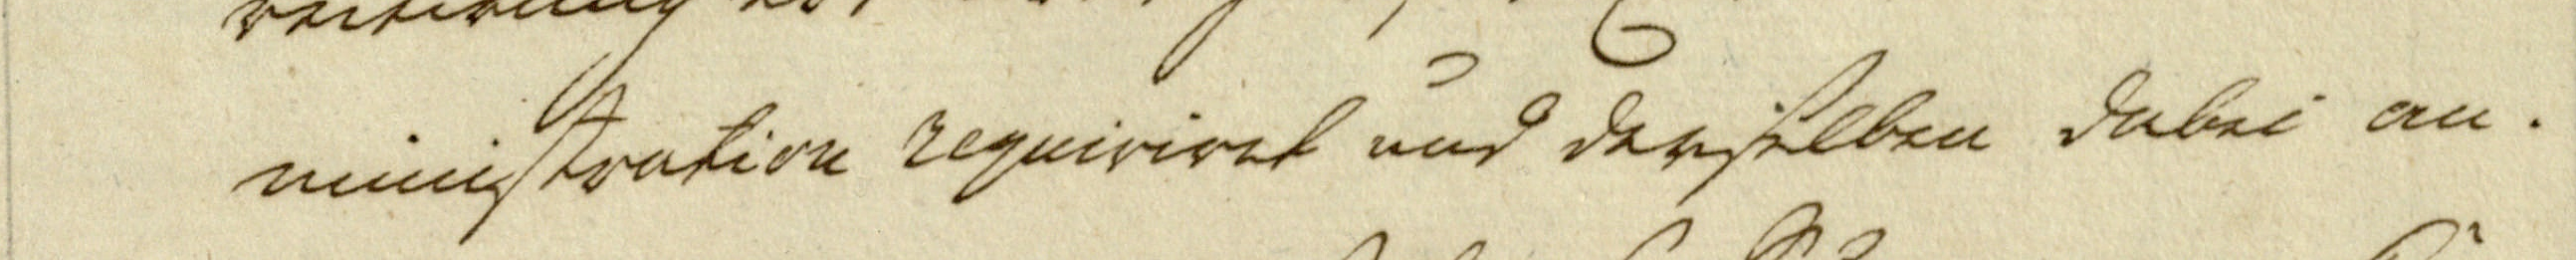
ministration requiriret und derselben dabei an¬
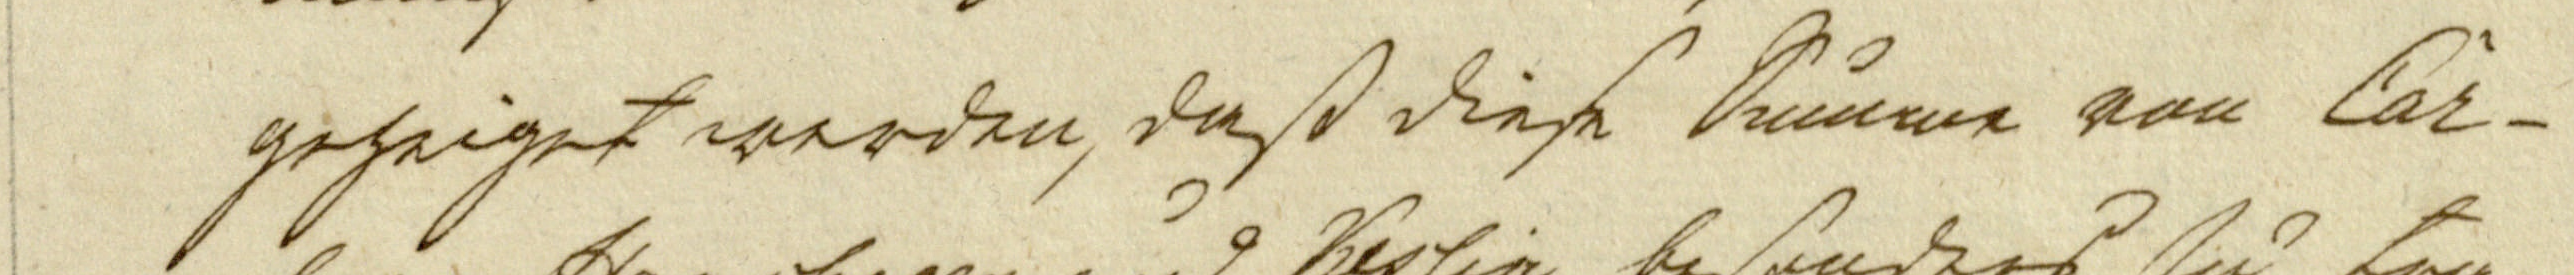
gezeiget werden, daß diese Summe von Car¬
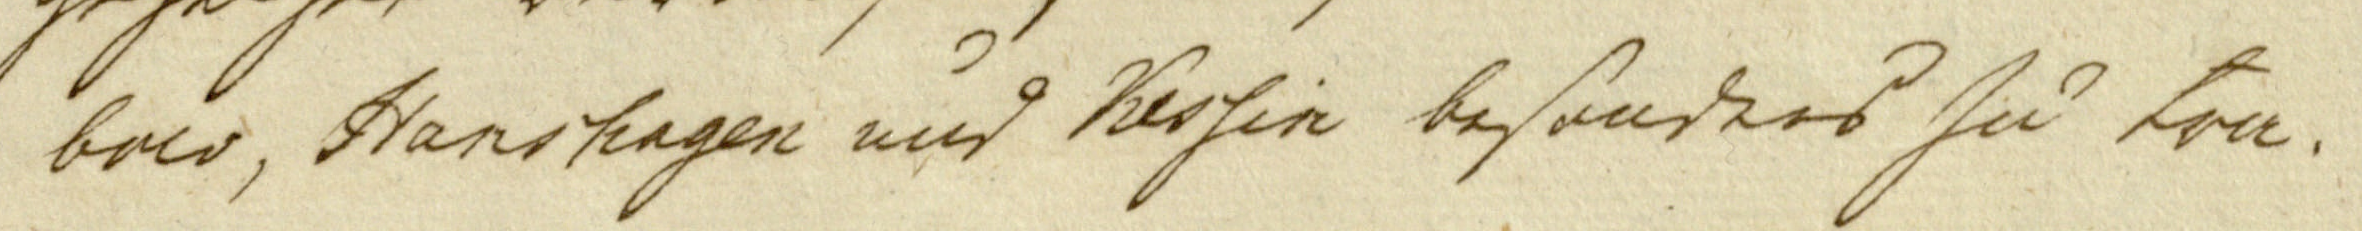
bow, Hanshagen und Kessin besonders zu tra¬
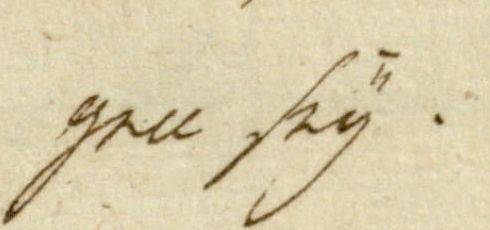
gen seÿ.
